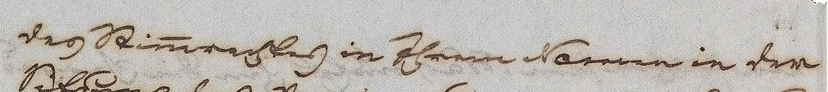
des Stimmrechtes in Ihrem Namen in der
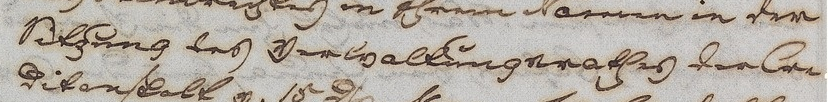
Sitzung des Verwaltungsrathes der Cre-
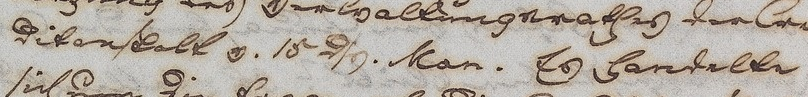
ditanstalt v. 15. dss. Mon. Es handelte
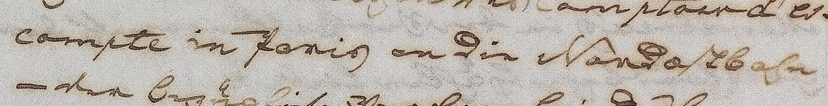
compte in Paris an die Nordostbahn
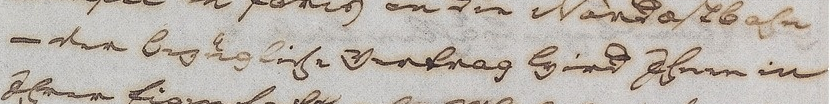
– der bezügliche Vertrag wird Ihnen in
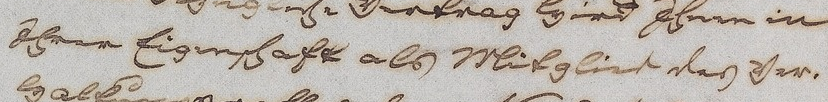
Ihrer Eigenschaft als Mitglied des Ver-
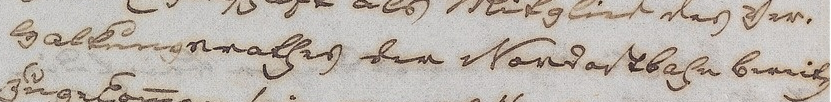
waltungsrathes der Nordostbahn bereits
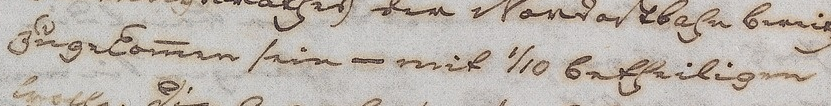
zugekommen sein – mit 1/10 betheiligen
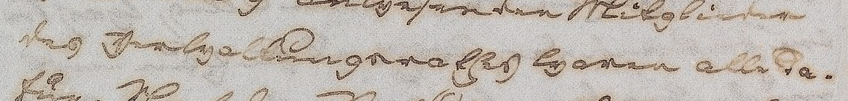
des Verwaltungsrathes waren alle da-
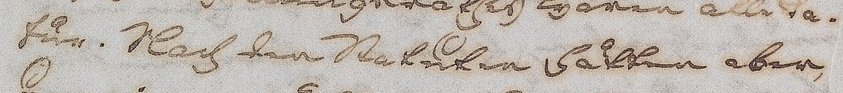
für. Nach den Statuten hätten aber,
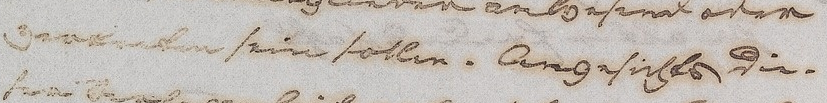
vertreten sein sollen. Angesichts die-
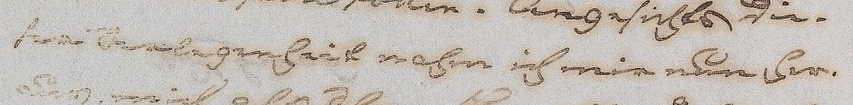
ser Verlegenheit nahm ich mir nun her-
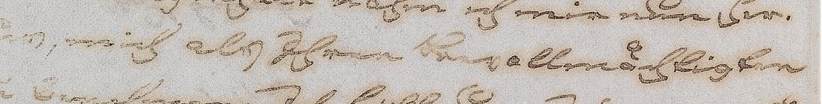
aus, mich als Ihren Bevollmächtigten
